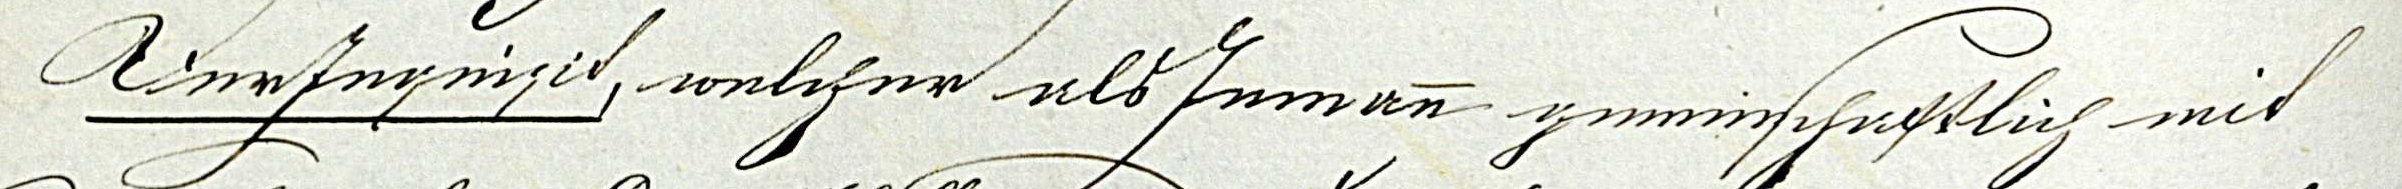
Der Inquisit, welcher als Jemann gemeinschaftlich mit
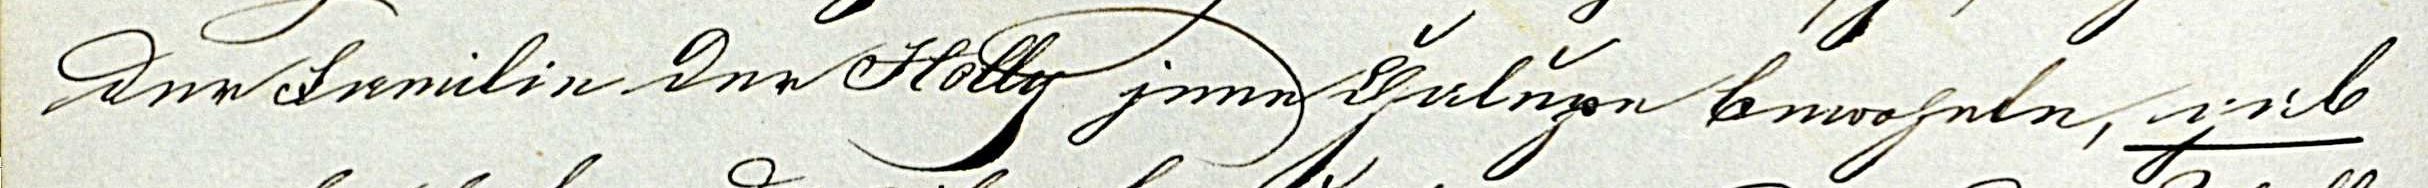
der Familie der Holly jene Chalupe bewohnte, gab
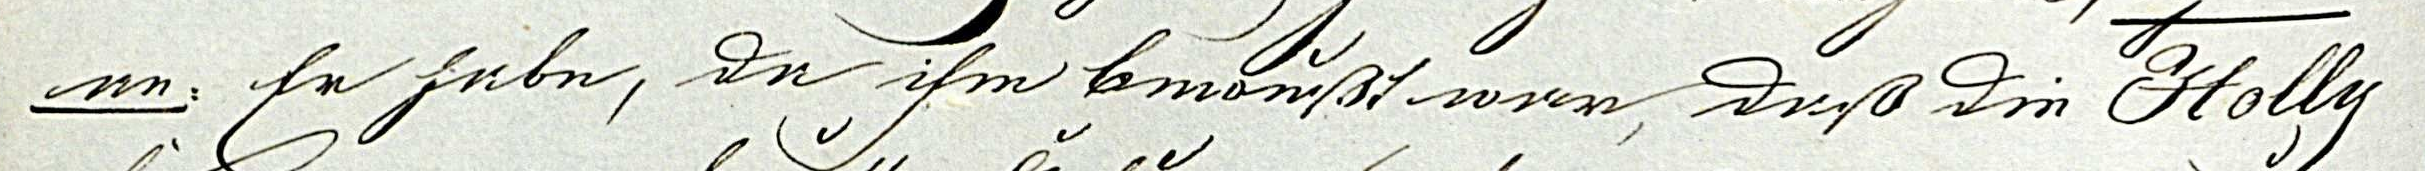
an: Er habe, da ihm bewußt war, daß die Holly
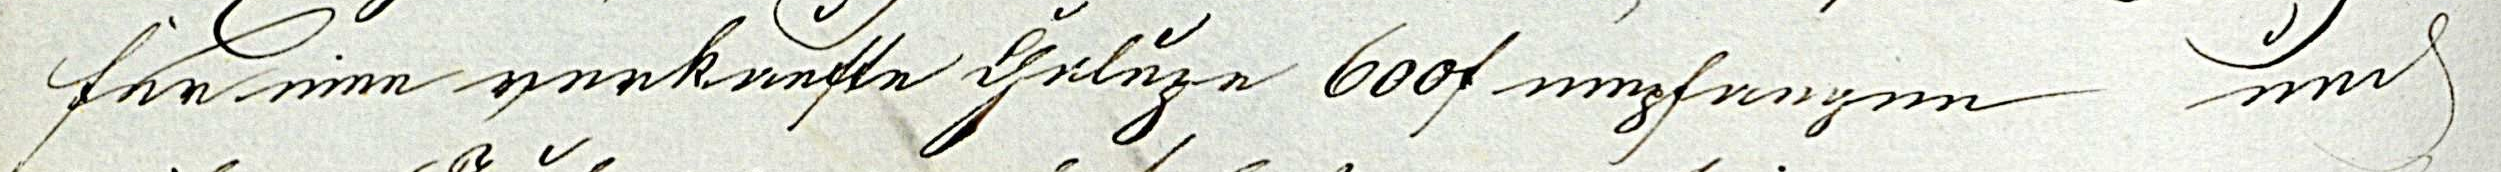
für eine verkaufte Chalupe 600f empfangen und
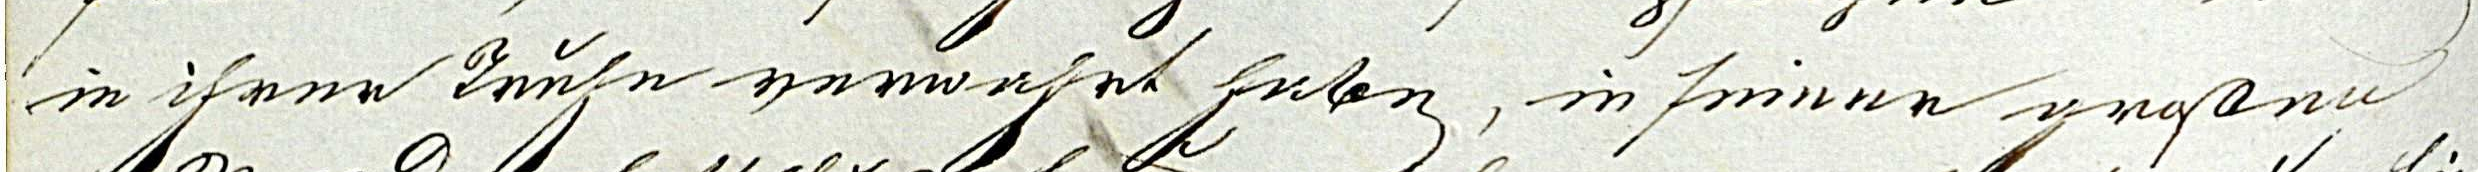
in ihrer Truhe verwahrt haben, in seiner großen
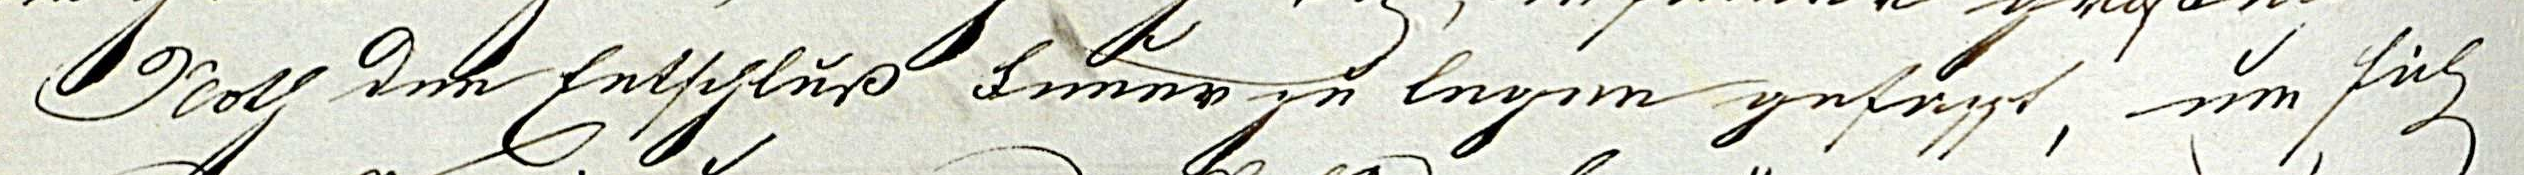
Noth den Entschluß Feuer zu legen gefasst, um sich
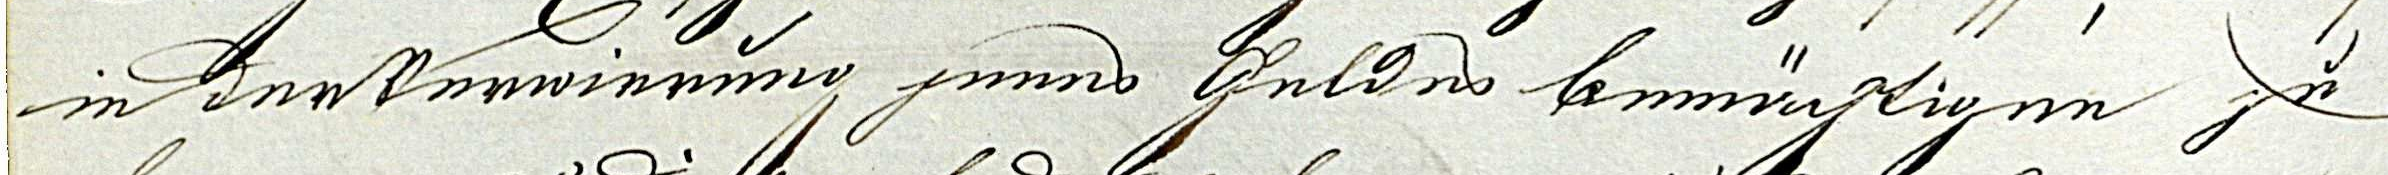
in der Verwirrung jenes Geldes bemächtigen zu
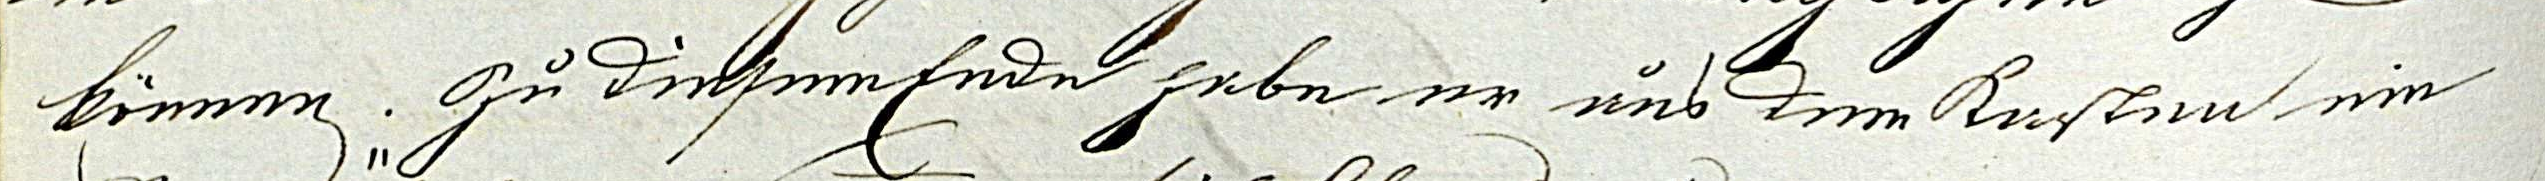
können. Zu diesem Ende gebe er aus dem Kasten ein
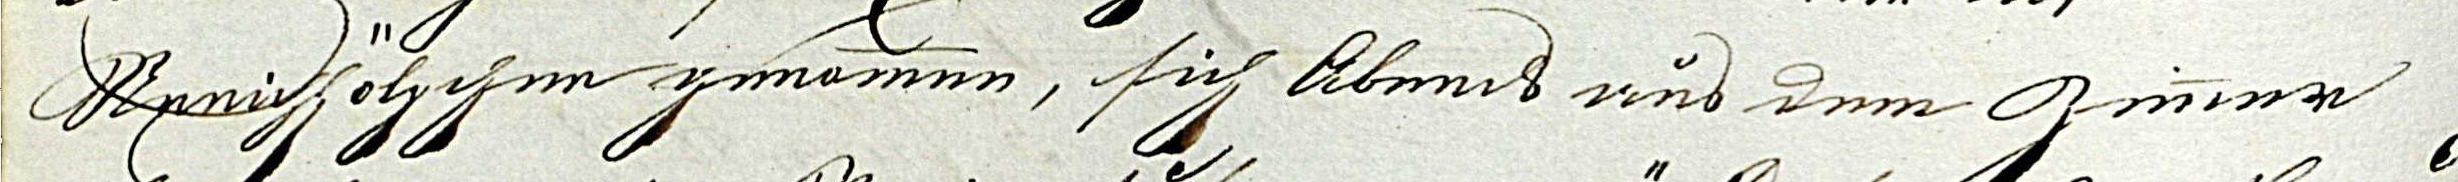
Streichhölzcehn genommen, sich Abend aus dem Zimmer
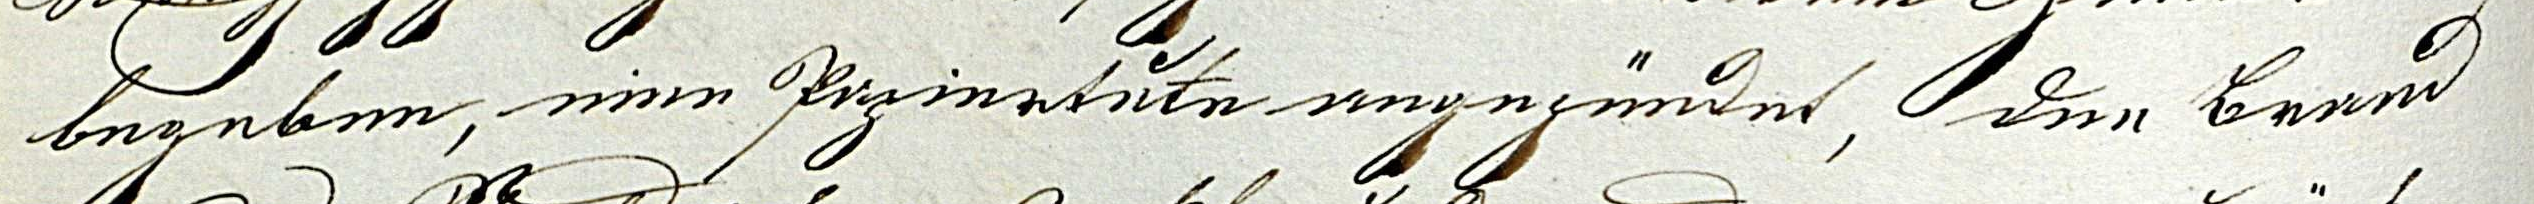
begeben, eine Papiertute angezündet, den Brand
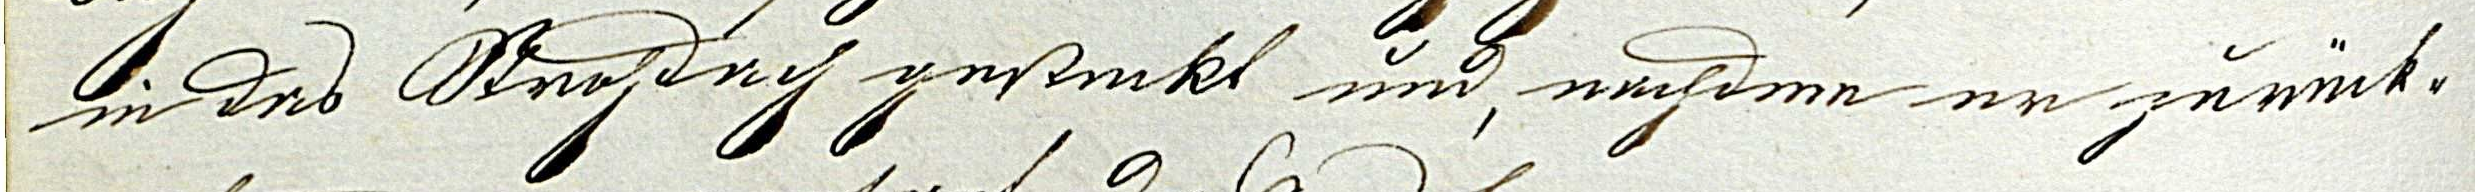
in das Strohdach gesenkt und, nachdem er zurück¬
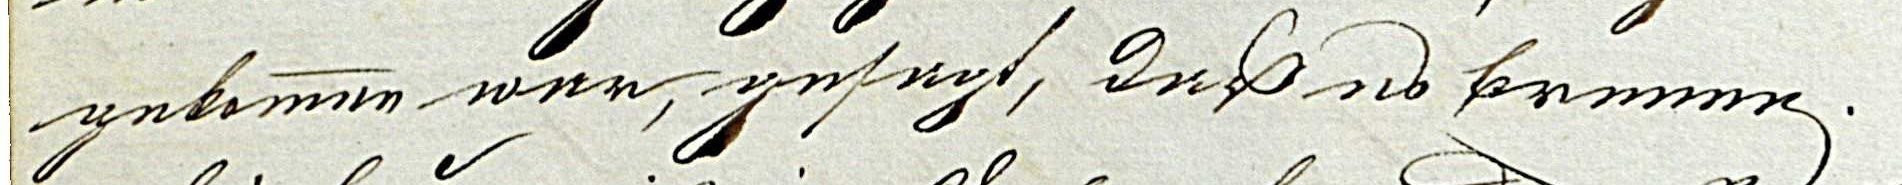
gekommen war, gesagt, daß es brenne.
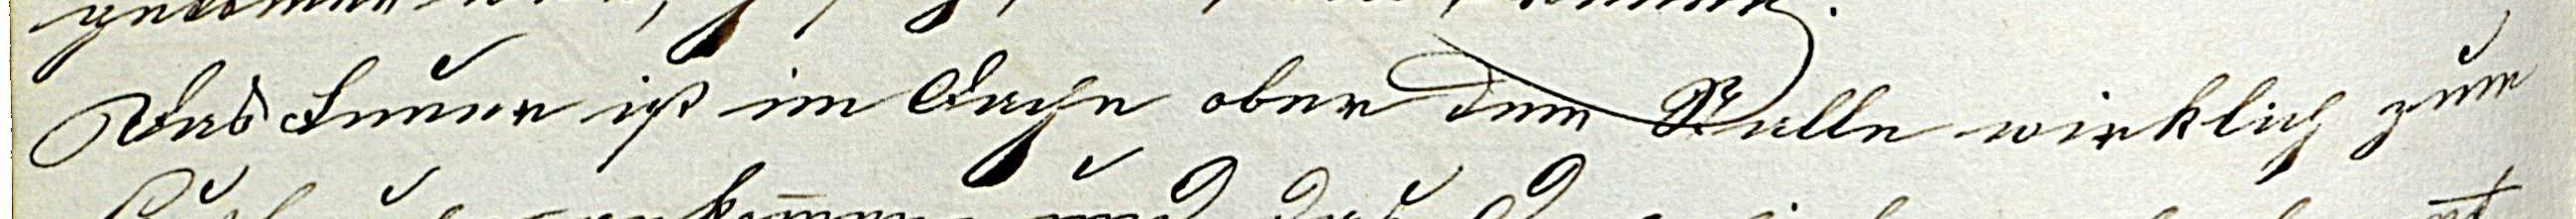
Das Feuer ist im Dache ober dem Stalle wirklich zum
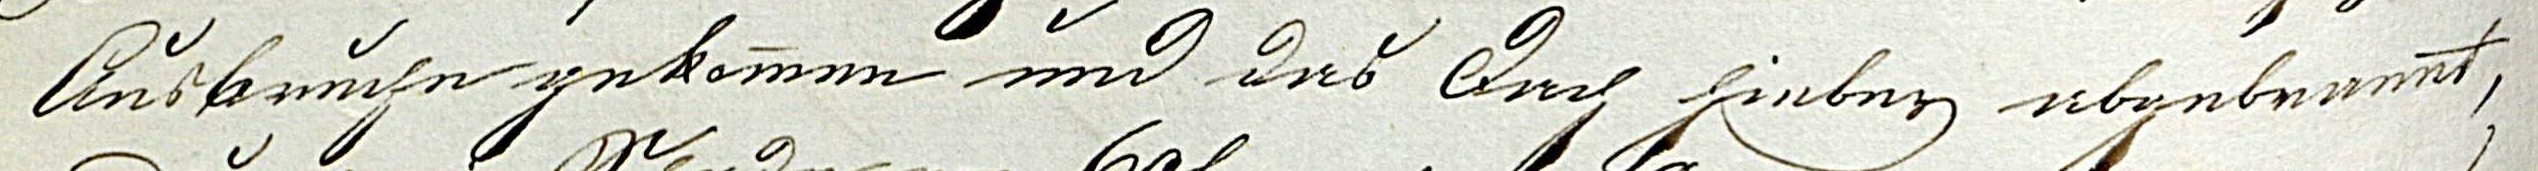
Ausbruche gekommen und das Dach hinber abgebrannt,
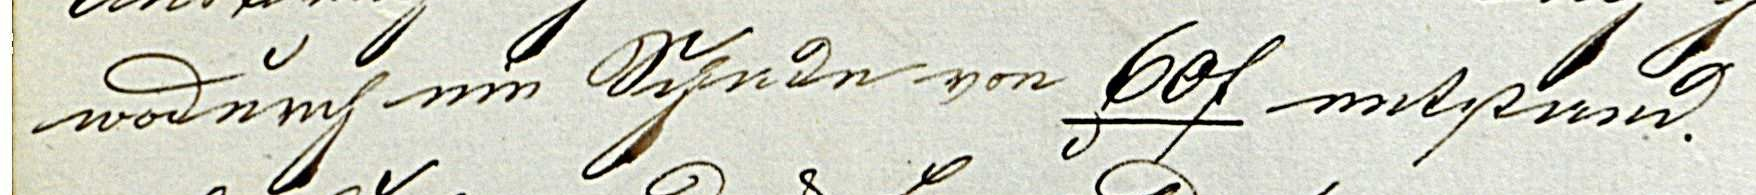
wodurch ein Schaden von 60f entstand.
